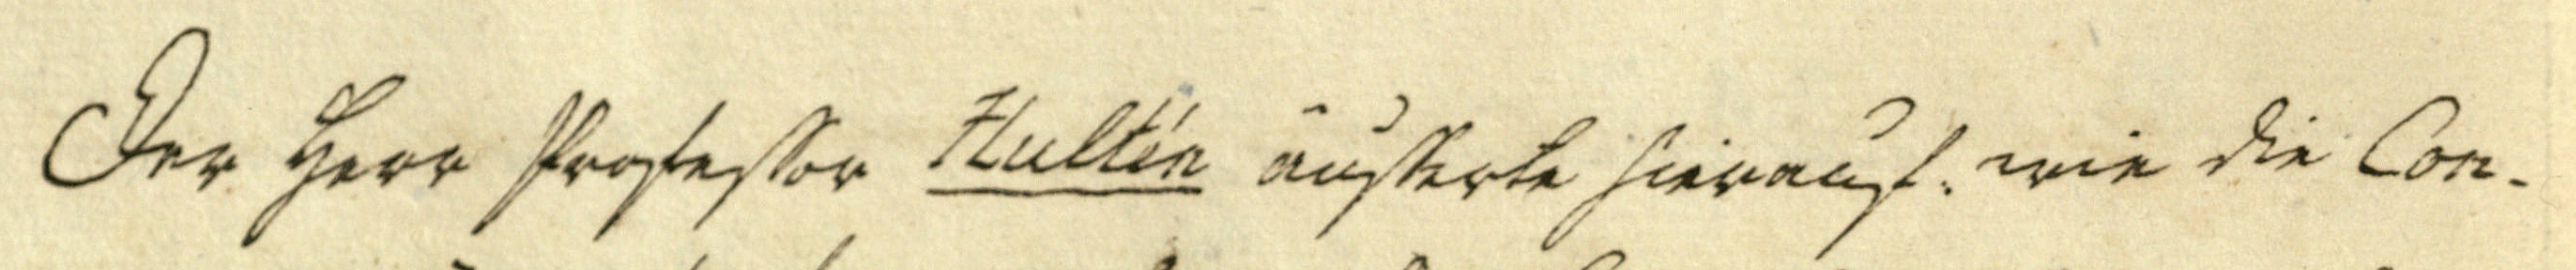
Der Herr Professor Hultén äußerte hierauf: wie die Con¬
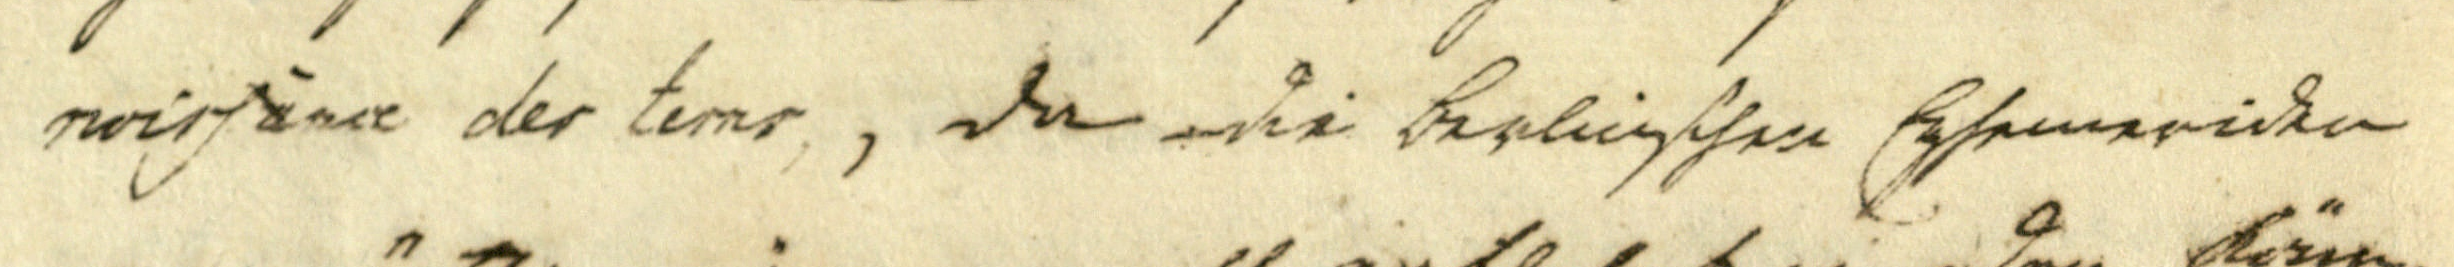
nvissance der terns, da die Berlinschen Exsemeriden
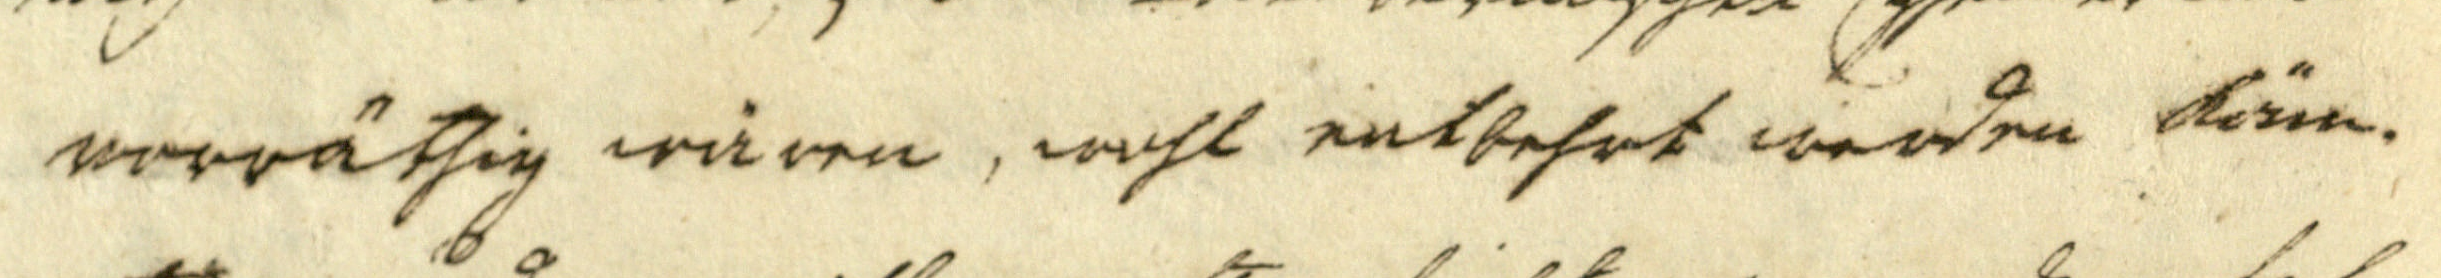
vorräthig wären, wohl entbehrt werden könn¬
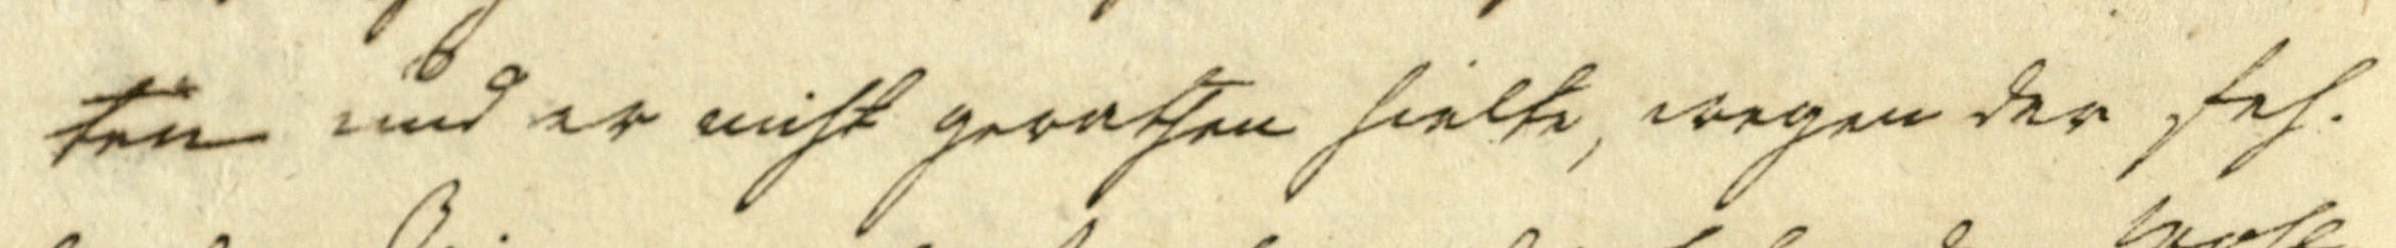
ten und er nicht gerathen hielte, wegen der feh¬
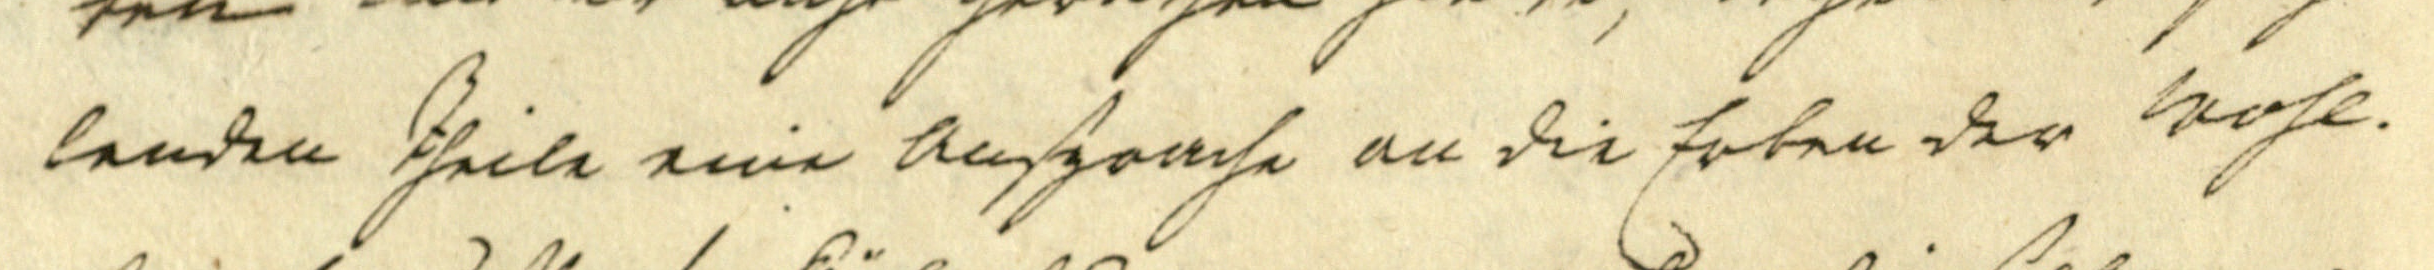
lenden Theile eine Ansprache an die Erben der Wohl¬
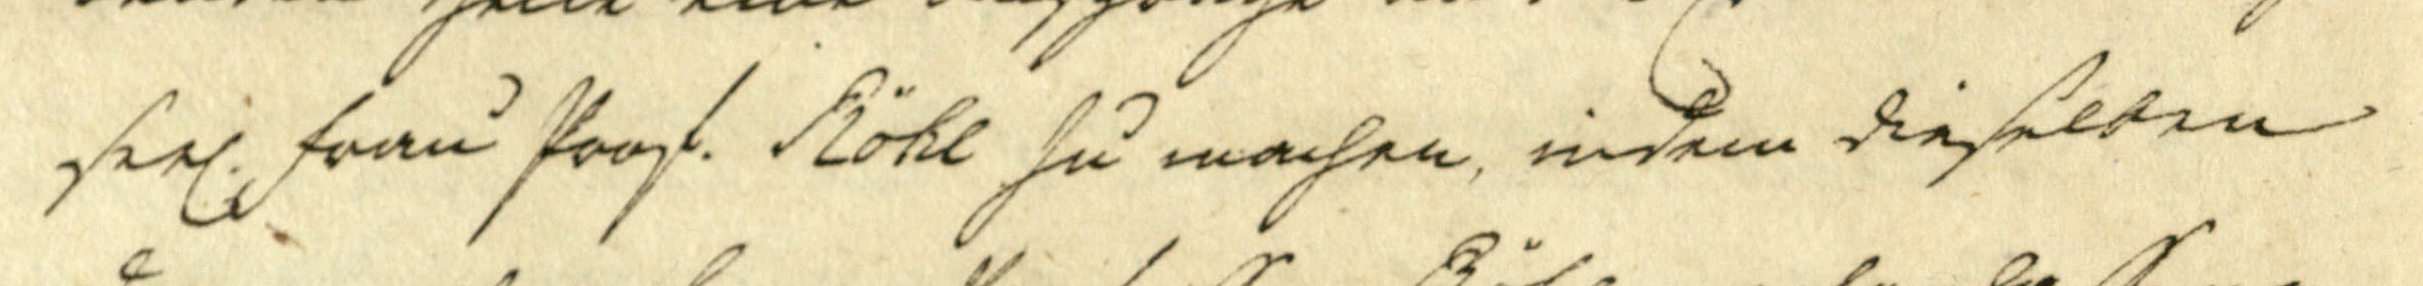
seel. Frau Prof. Röhl zu machen, indem dieselben
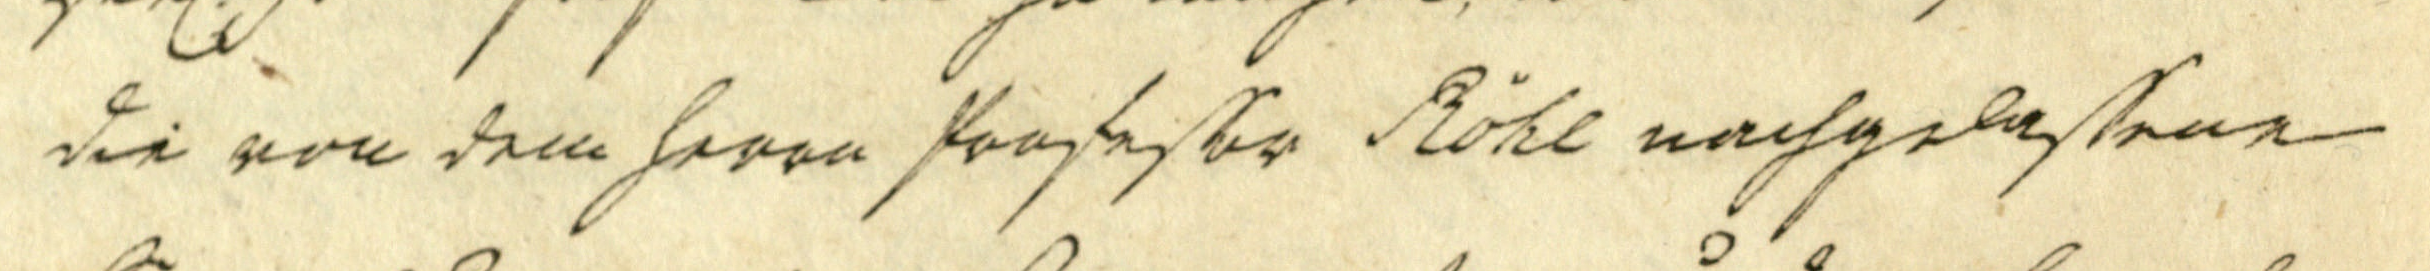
die von dem Herrn Professor Röhl nachgelassenen
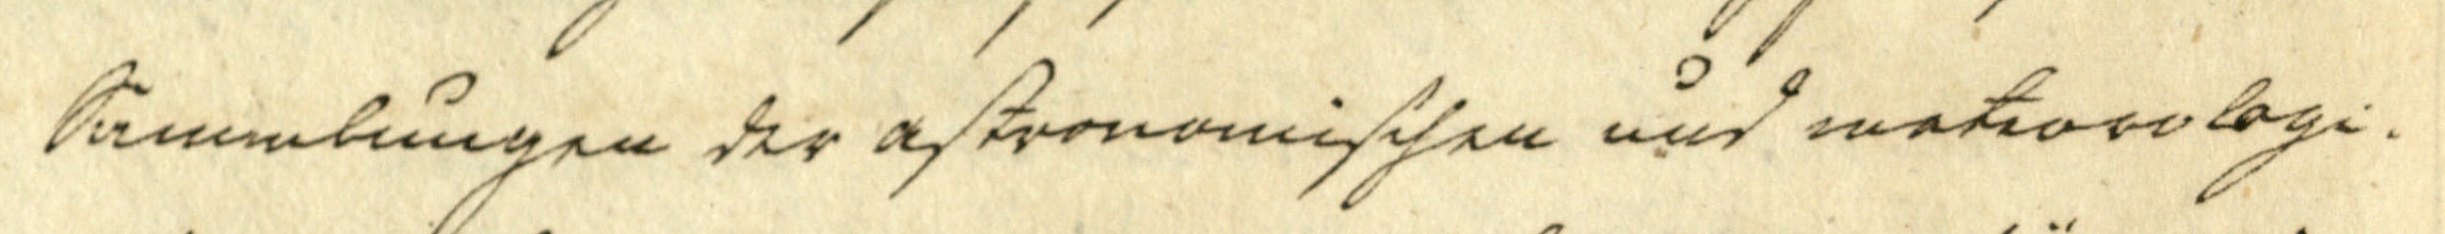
Sammlungen der astronomischen und meteorologi¬
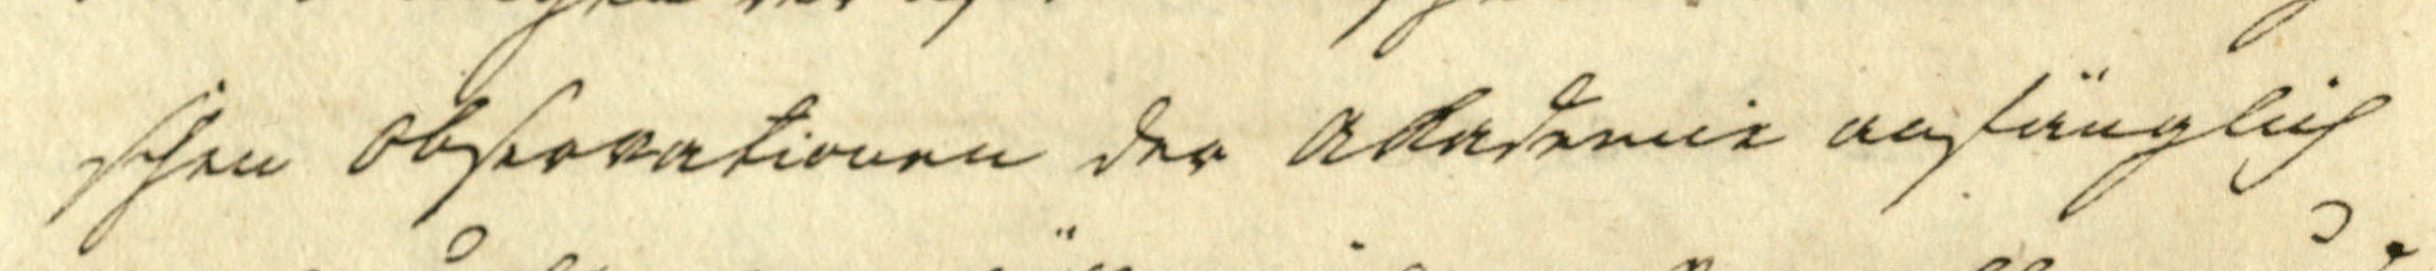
schen Observationen der Akademie anfänglich
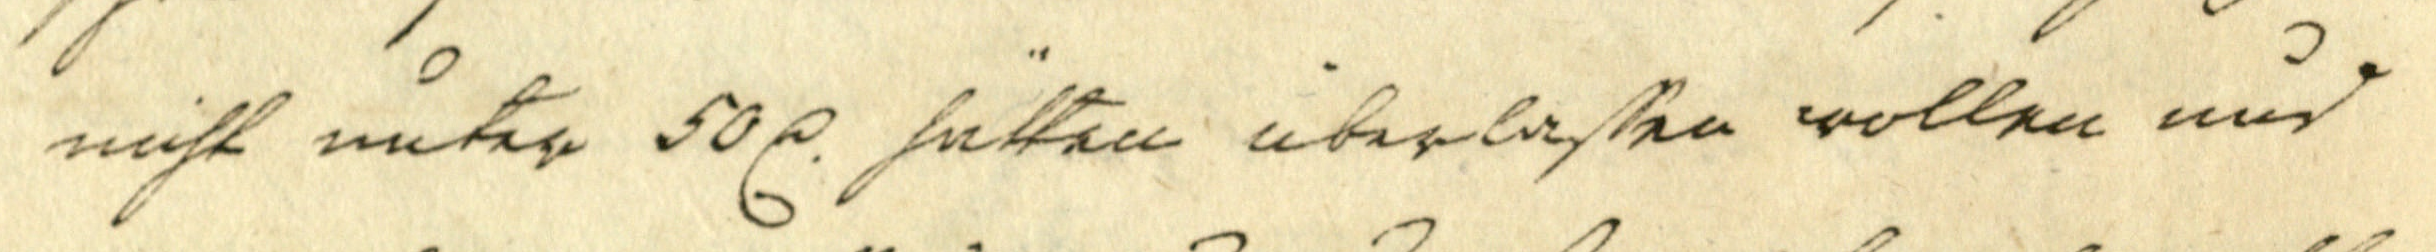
nicht unter 50 l. hätten überlassen wollen und
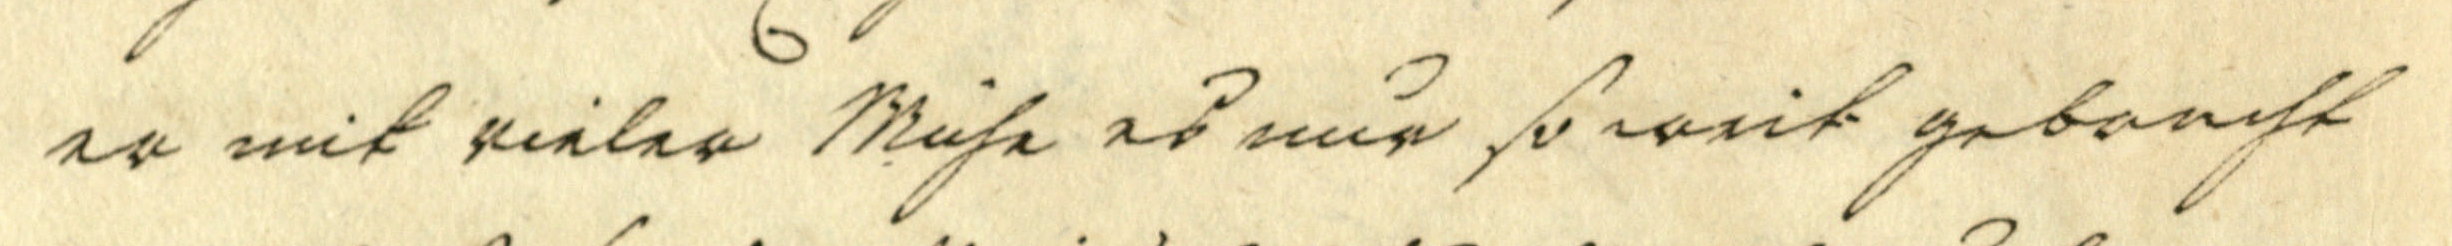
er mit vieler Mühe es nur so weit gebracht
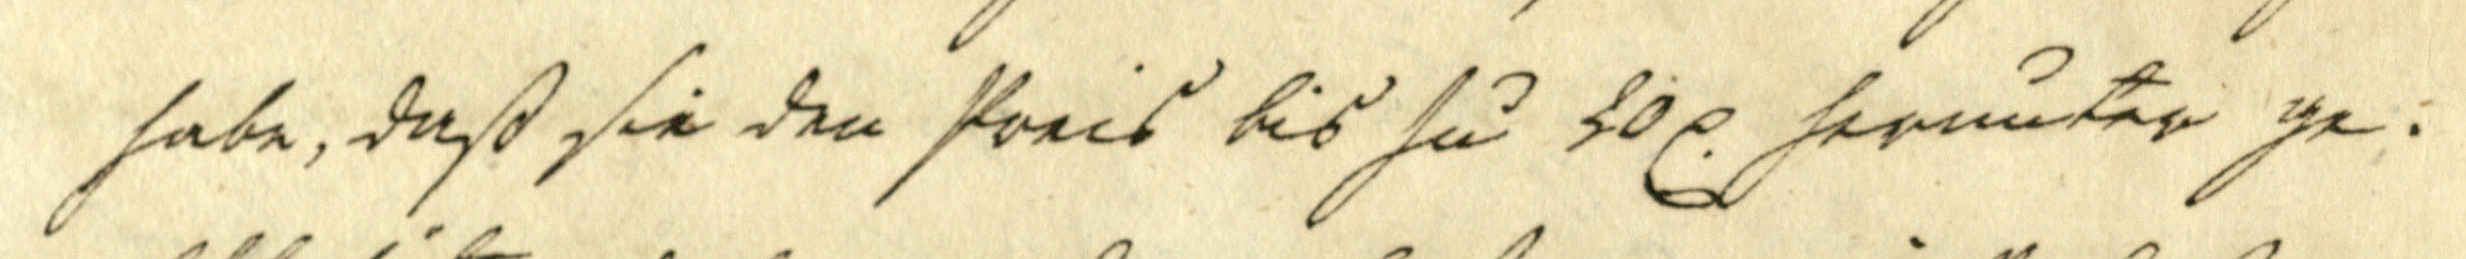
habe, daß sie den Preis bis zu 20 l. herunter ge¬
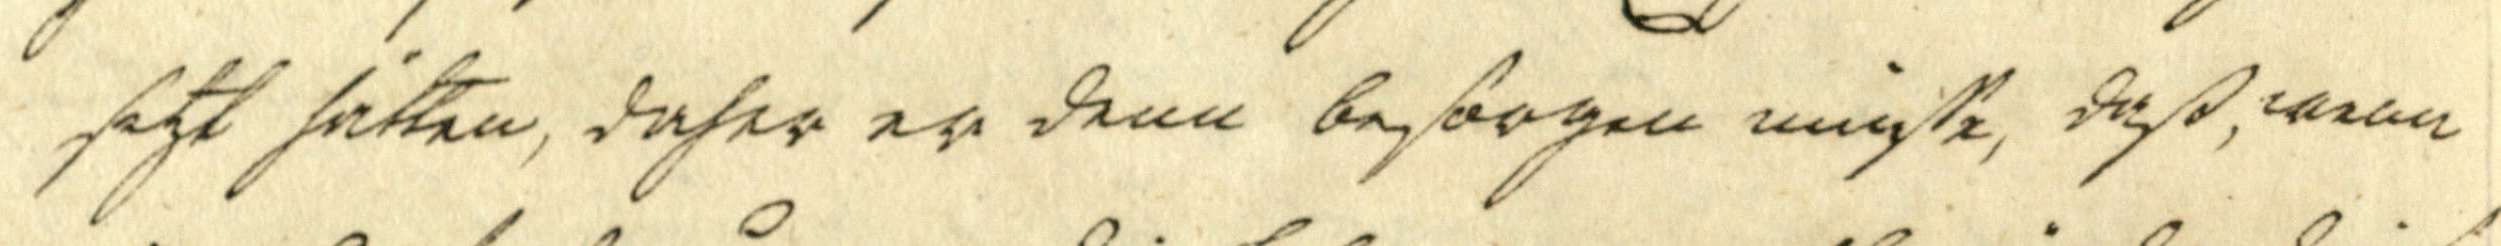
setzt hätten, daher er denn besorgen müsse, daß, wenn
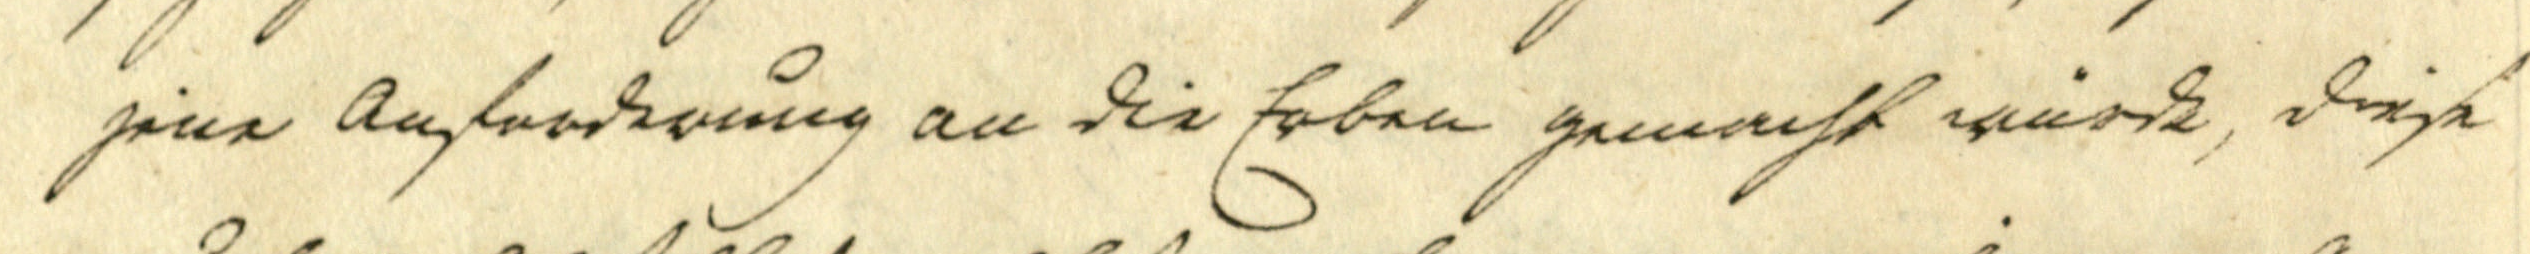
jene Anforderung an die Erben gemacht würde, diese
